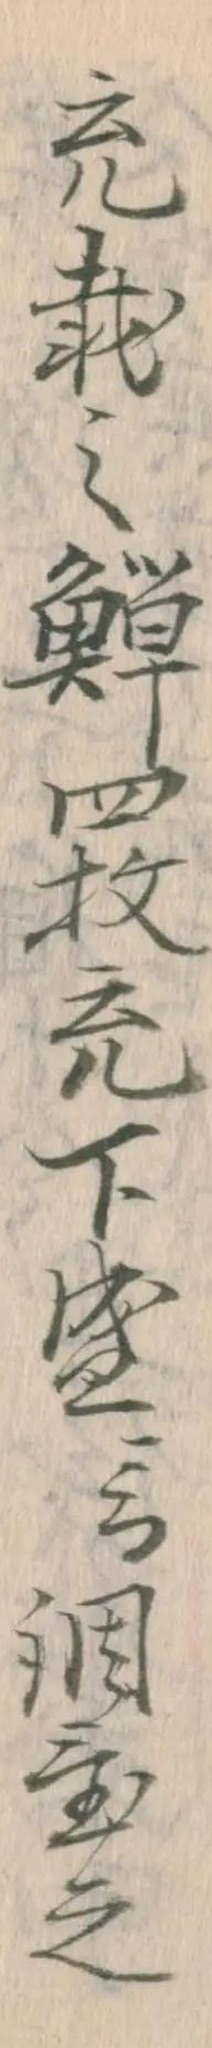充載之鱓四枚充下盛に而調置之
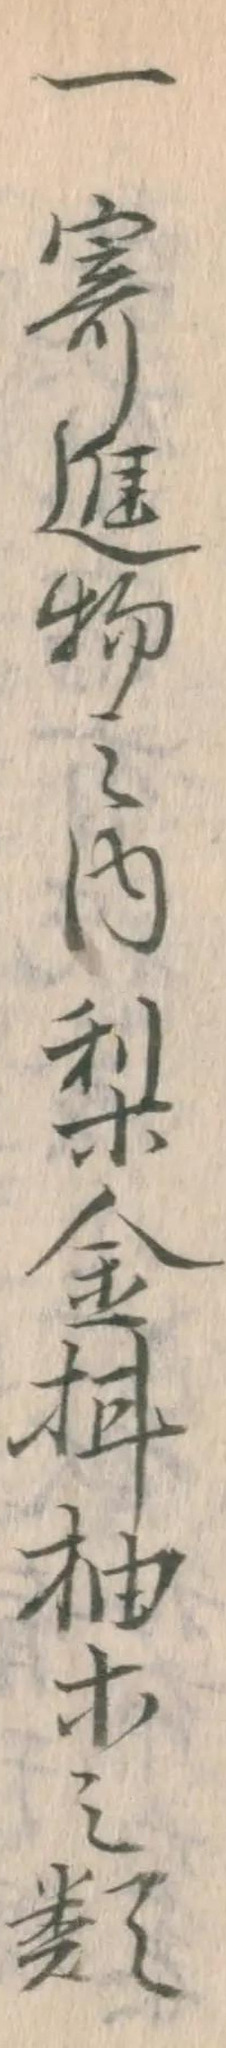一寄進物之内梨金柑柚等之類
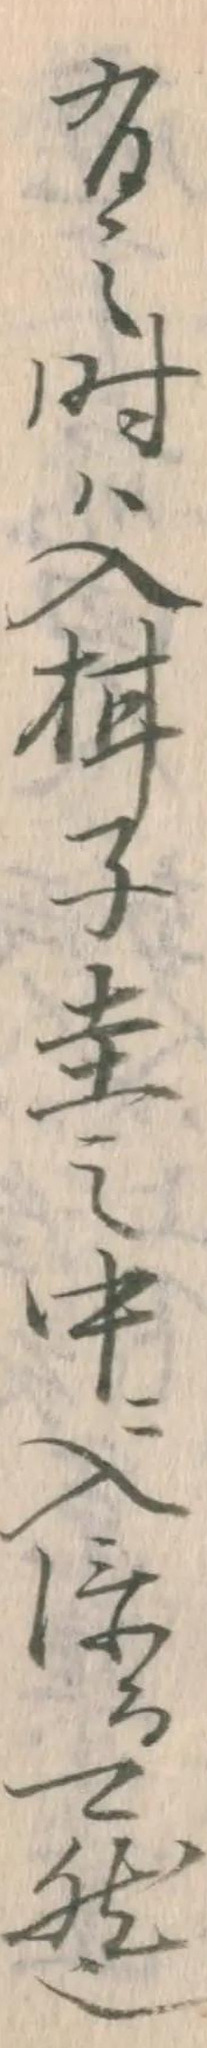有之時は入柑子圭之中に入添而可然也
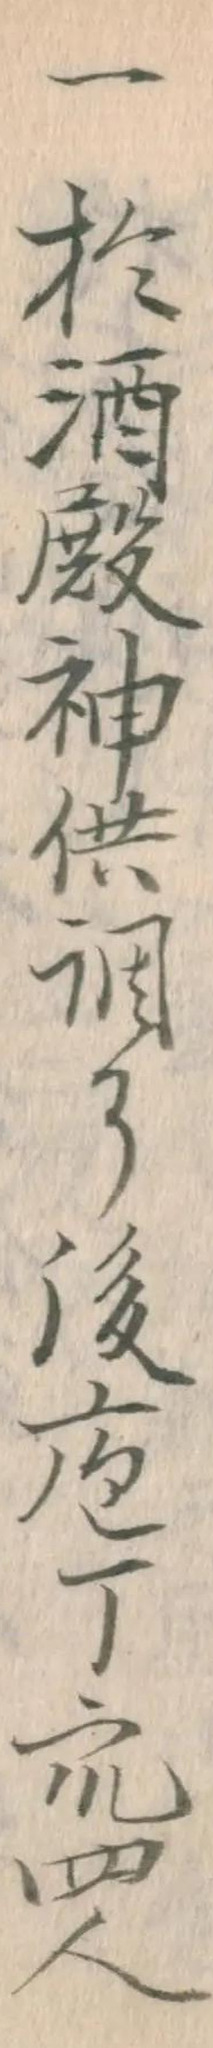一於酒殿神供調了後庖丁衆四人
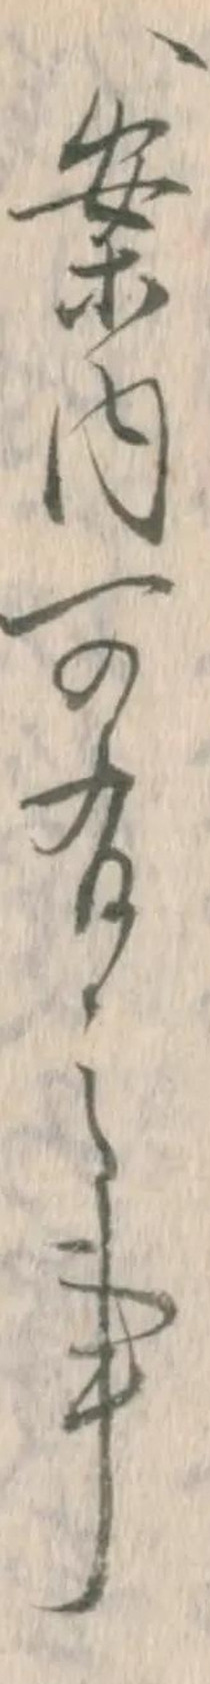へ案内可有之事
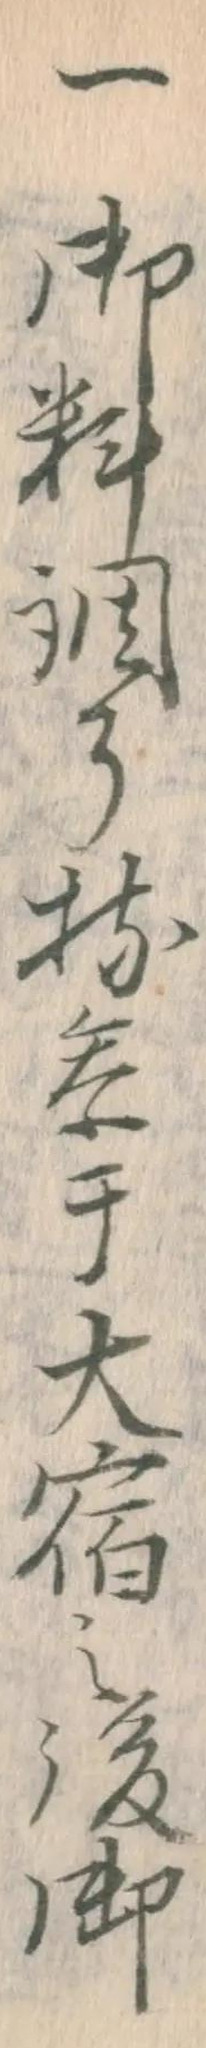一御料調了持参于大宿之後御
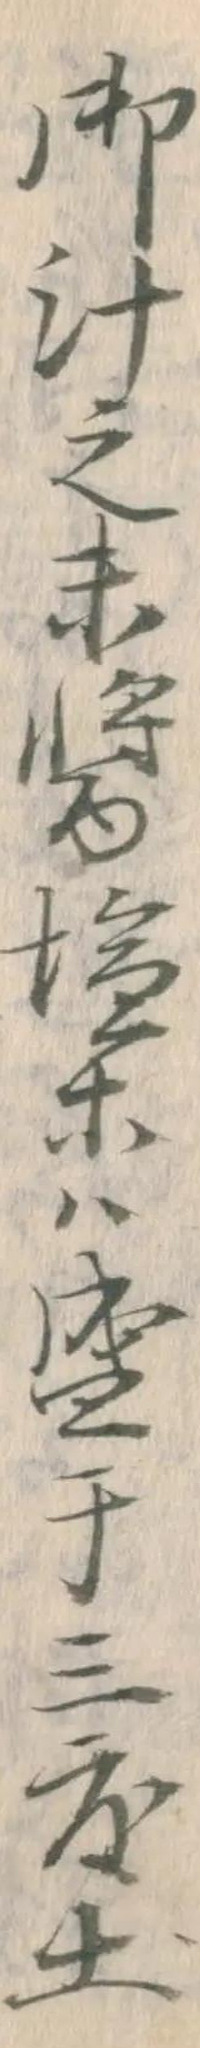御汁之未醤塩等は盛于三度土

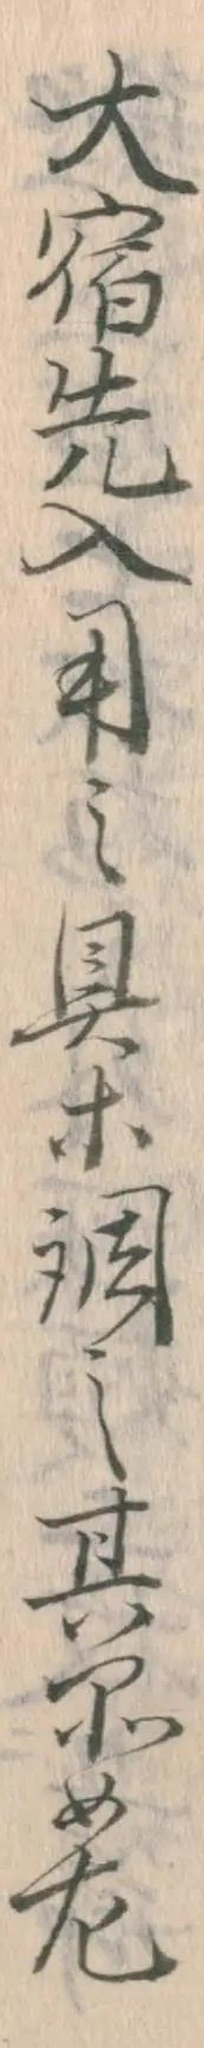大宿先入用之具等調之其品如左
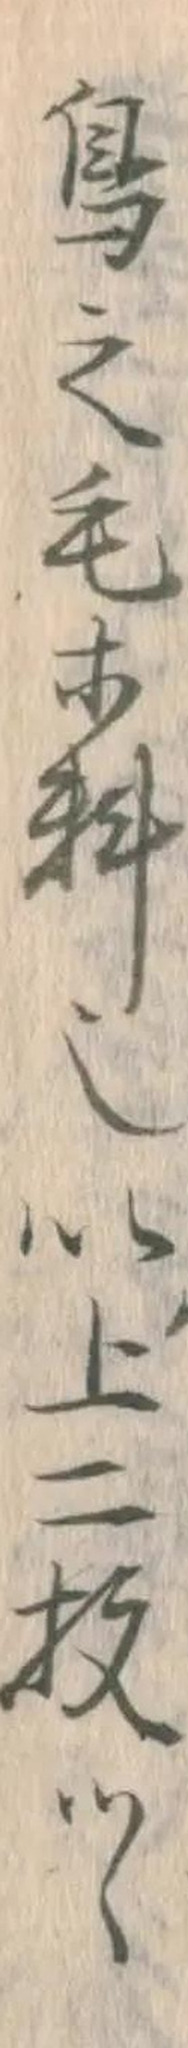鳥之毛等料也以上二枚ツヽ

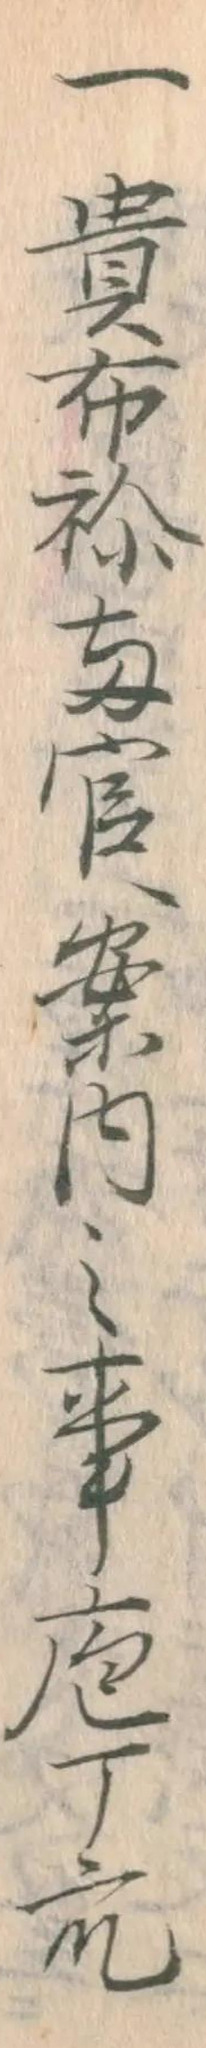一貴布祢両官へ案内之事庖丁衆
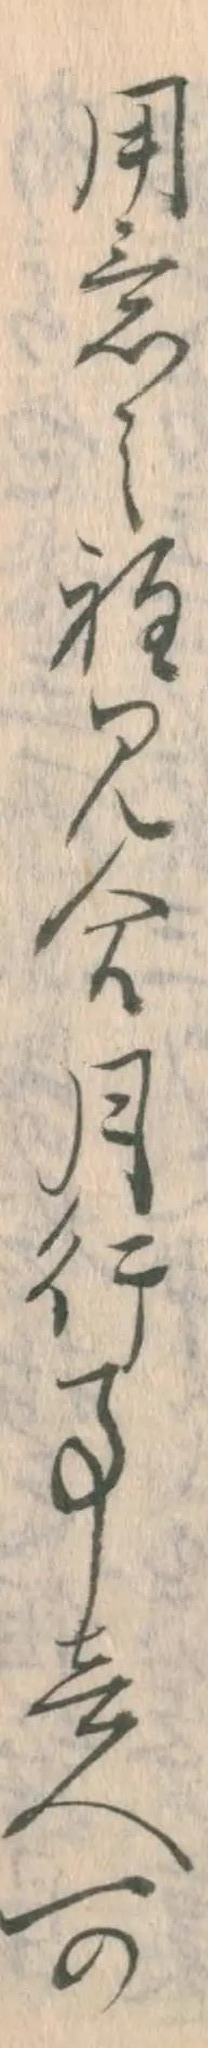用意之程見合月行事壱人可
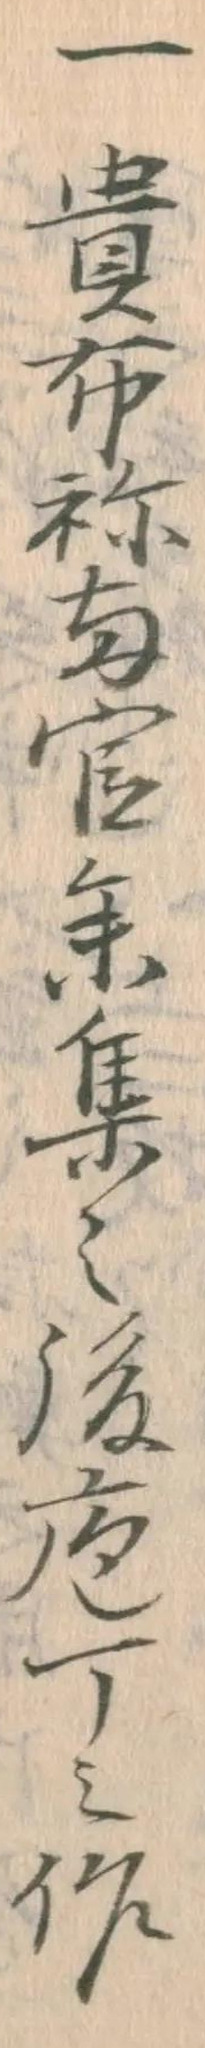一貴布称両官参集之後庖丁之作
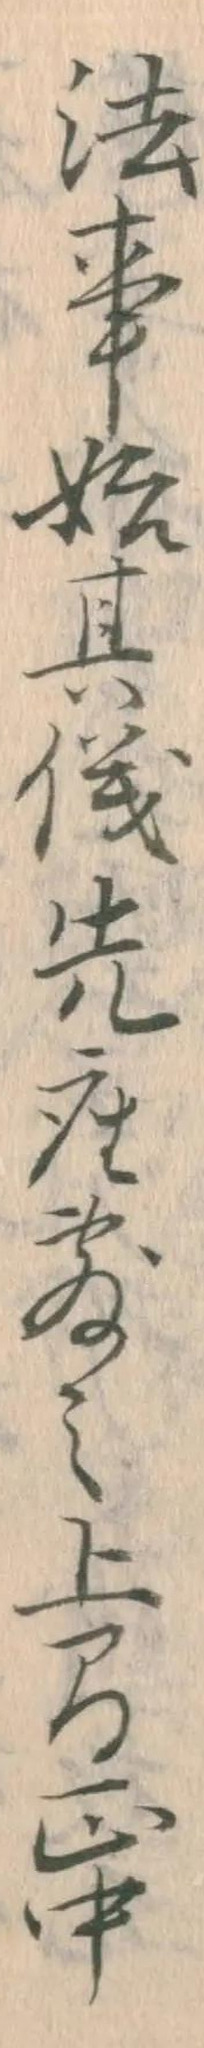法事始其儀先座敷之上間正中
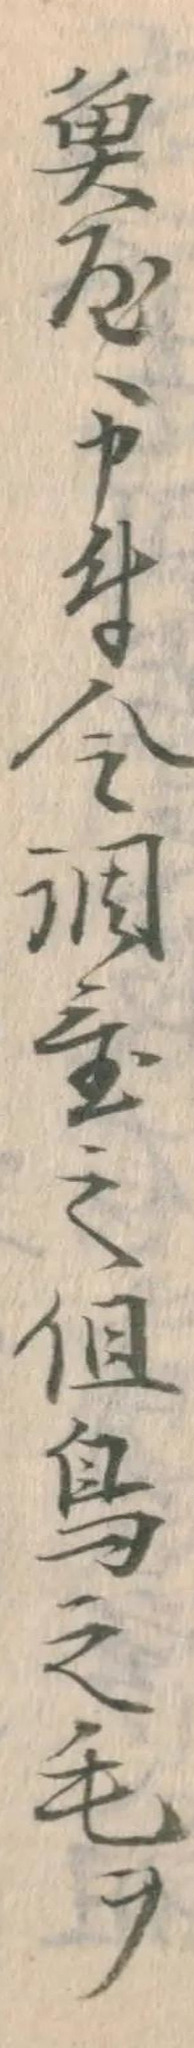魚屋へ申付令調置之但鳥之毛ヲ
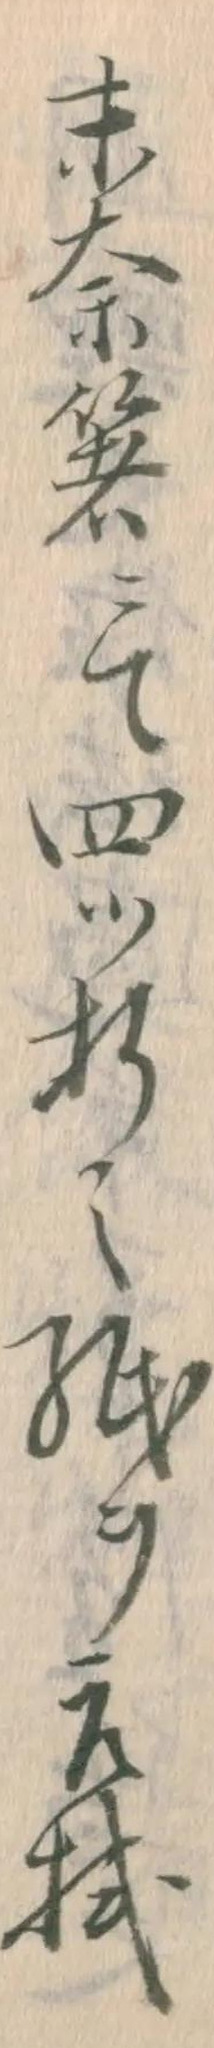未奈箸にて四ツ折之紙ヲ取拭
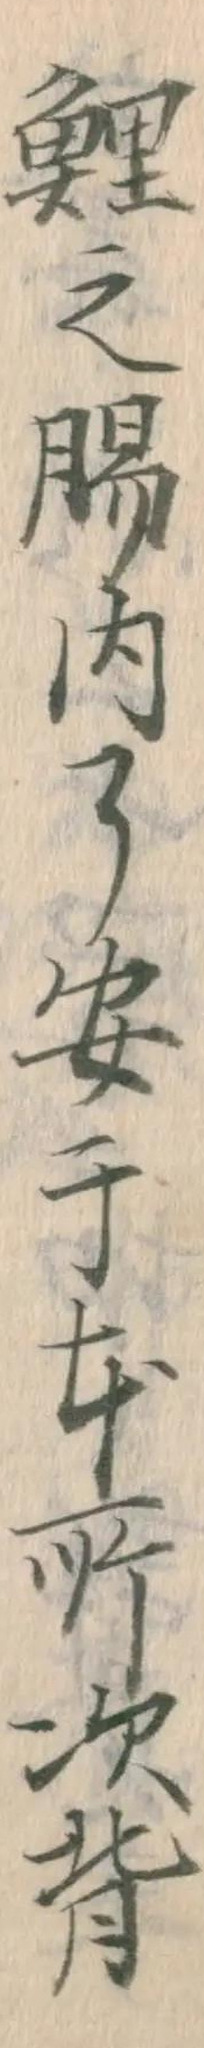鯉之腸内了安干本所次背
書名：賀茂社記録. 第81冊
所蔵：国立国会図書館 National Diet Library, JAPAN
